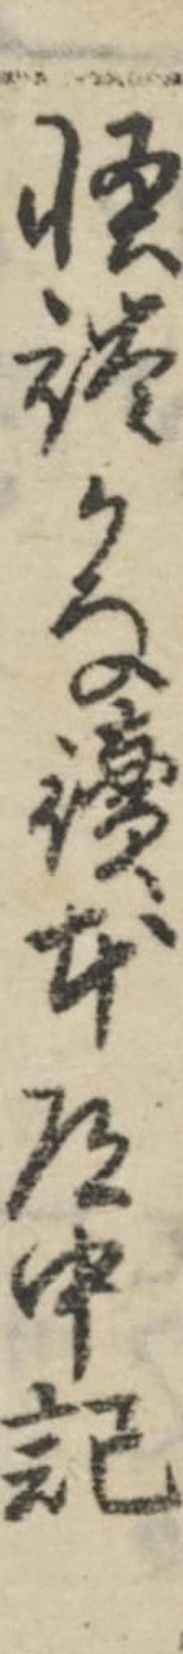怪談かな読本道中記
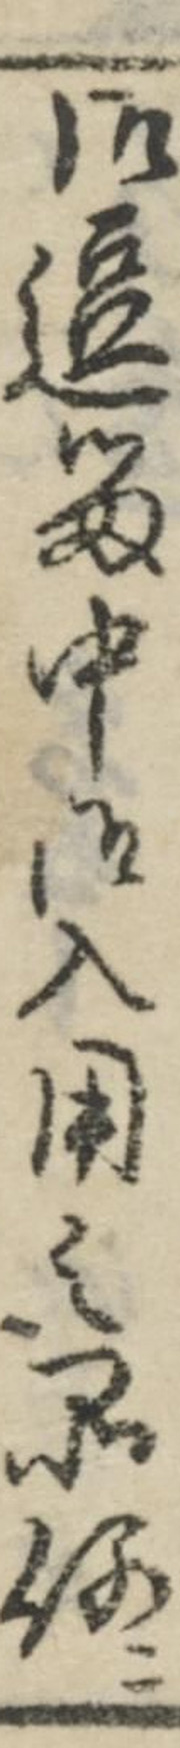御逗留中御入用之品何に
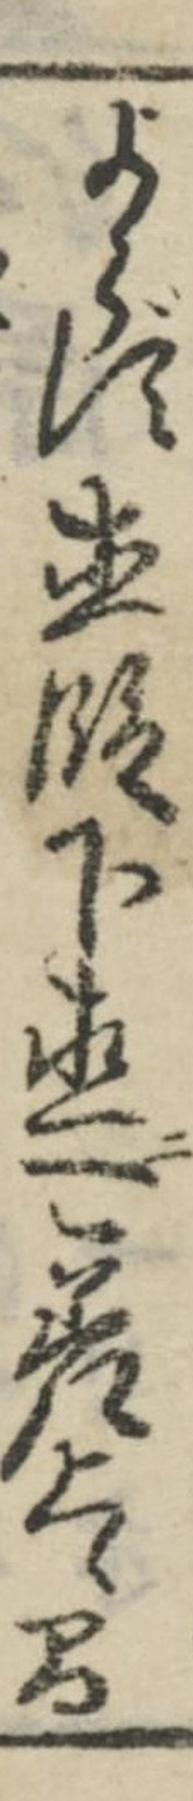よらす直段下直に可差上候間
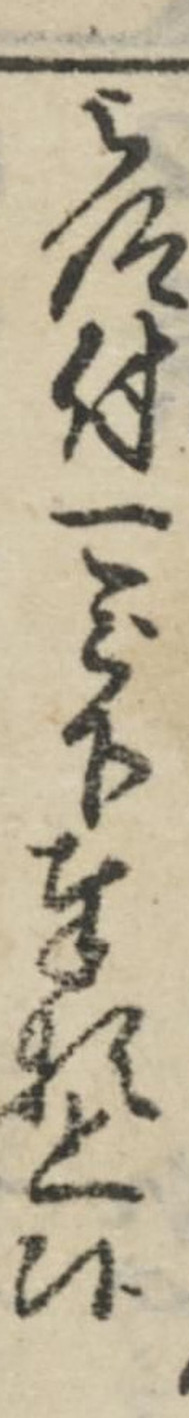被仰付可被下奉願上候
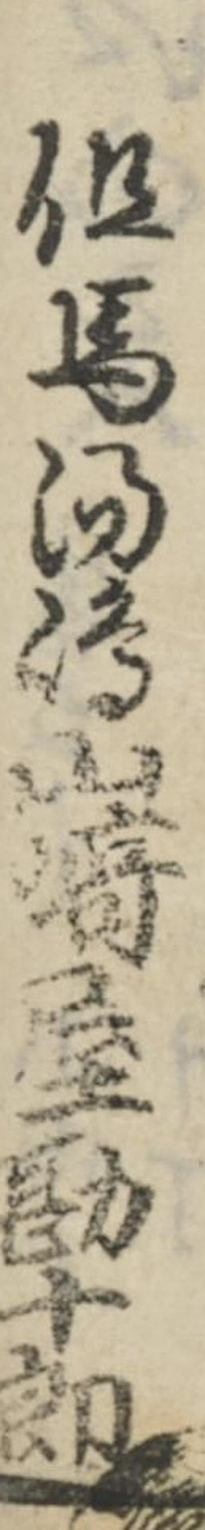但馬湯嶋山崎屋勘十郎
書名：但州城崎浴湯辧
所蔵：東京大学地震研究所図書室 Earthquake Research Institute Library, The University of Tokyo, JAPAN
